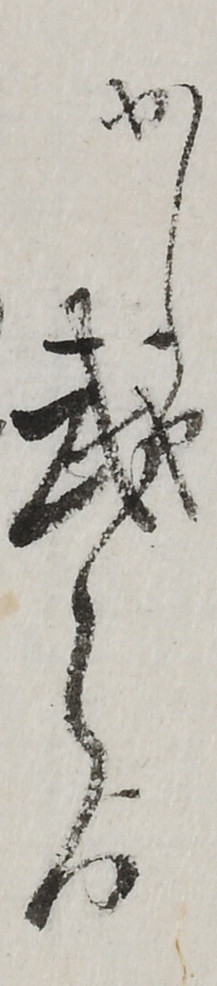武右衛門
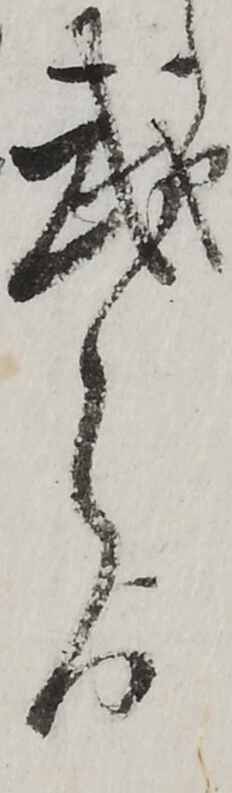武右衛門

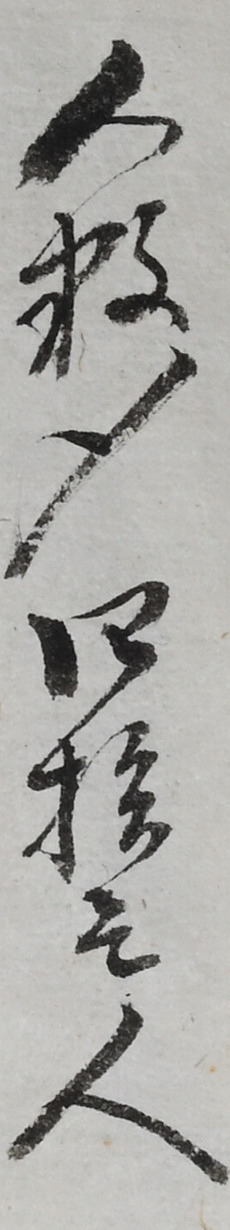人数〆四拾壱人
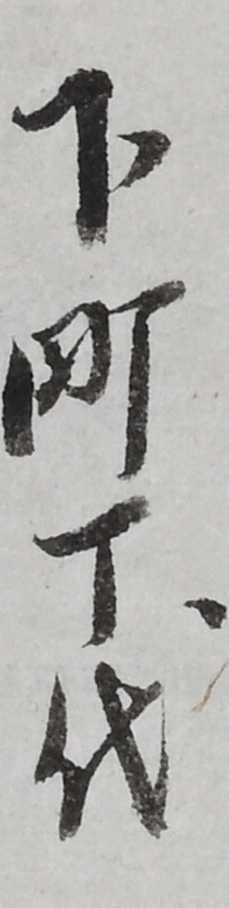下町丁代
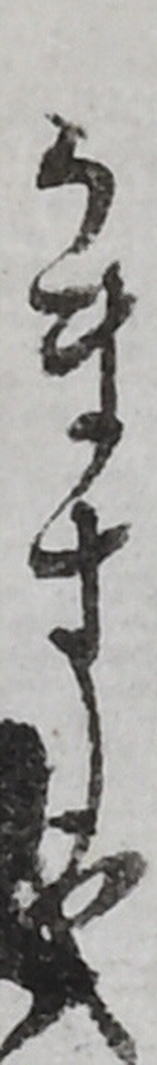かますや
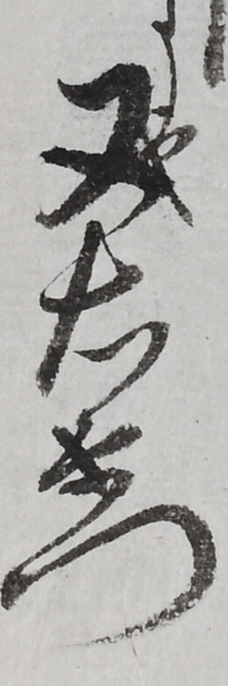又右衛門
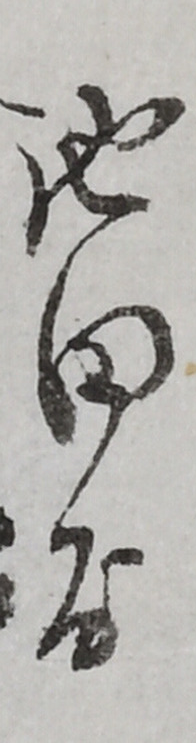池田屋
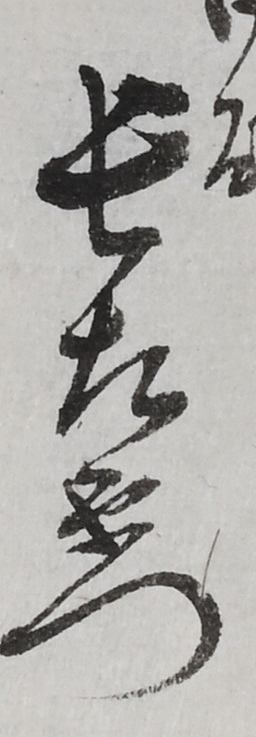長左衛門
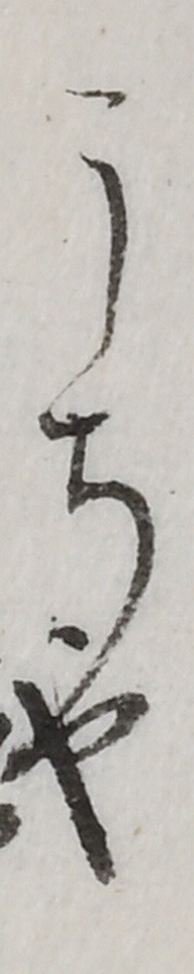うちや
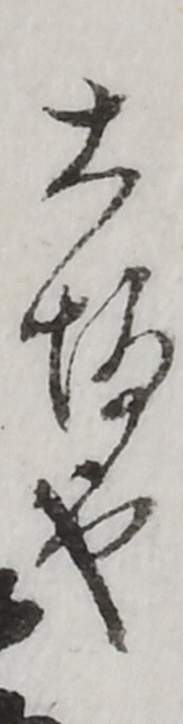大阪や
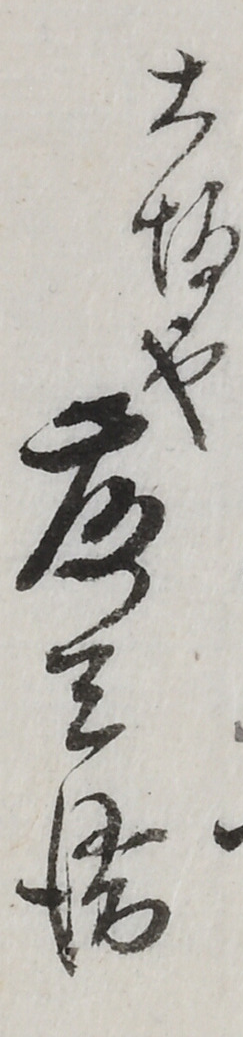藤兵衛
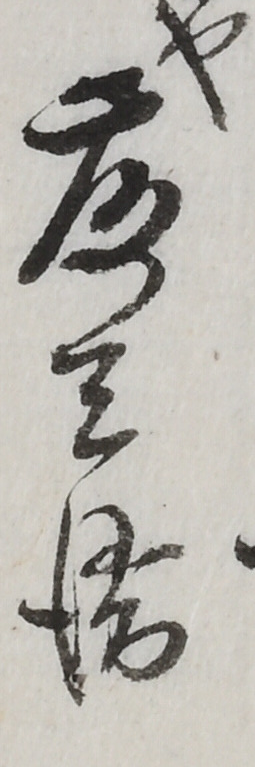藤兵衛
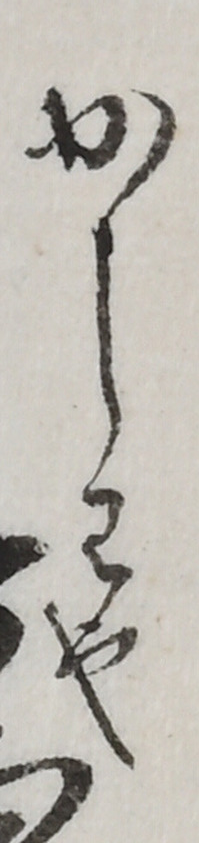かしわや
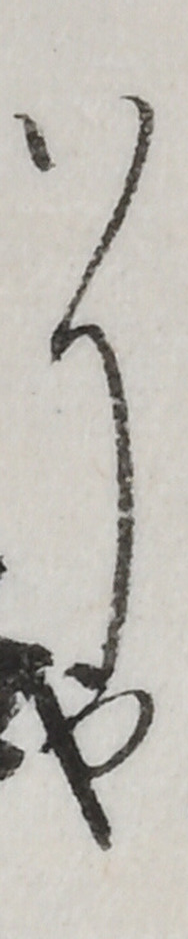いりや
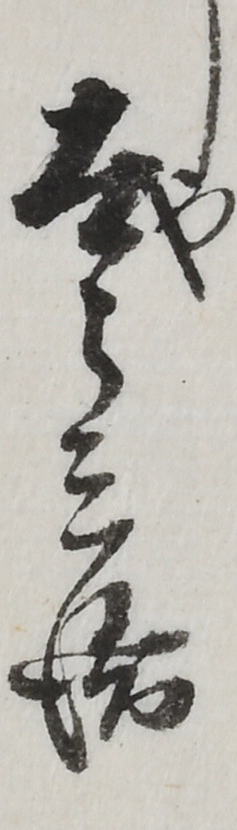左郎兵衛
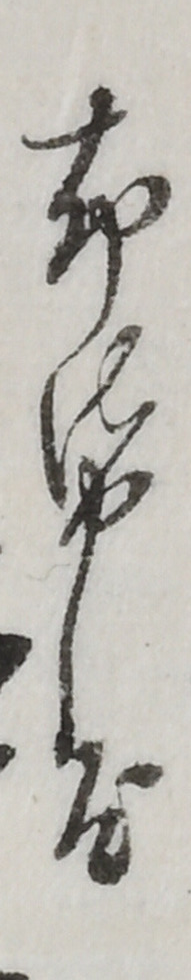布袋屋
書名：當町火消道具幷役附帳
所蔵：伊那市立高遠町図書館・合同会社AMANE
